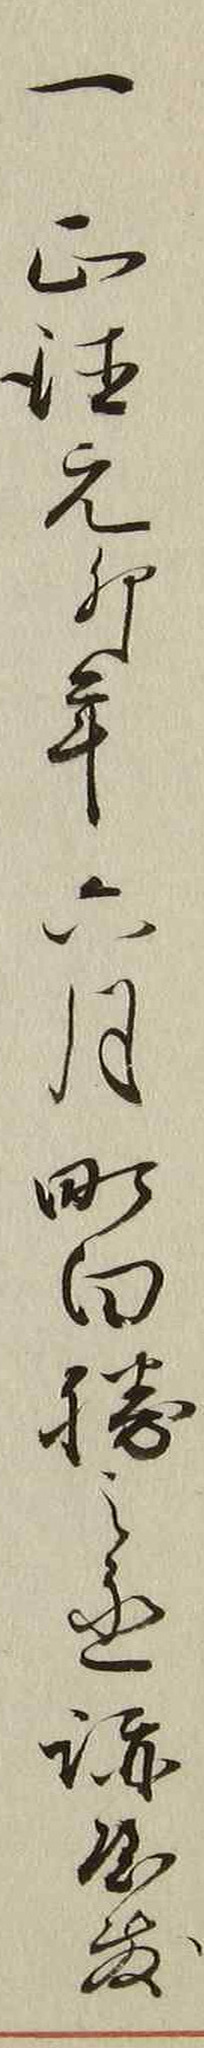一正徳元卯年六月町田勝之丞跡屋敷
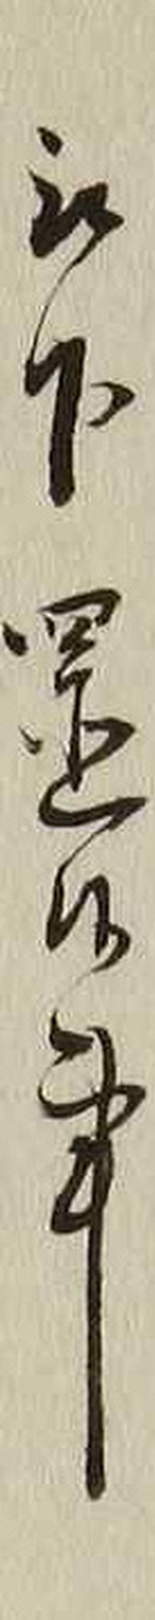被下置候事
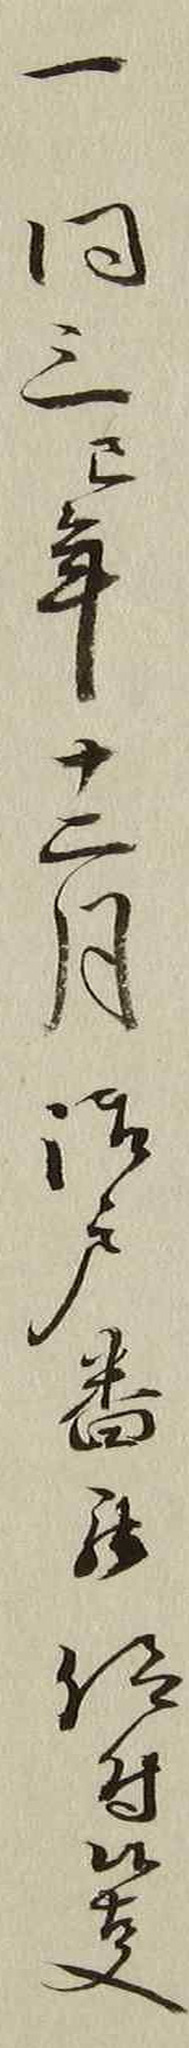一同三巳年十二月御戸番被仰付候事
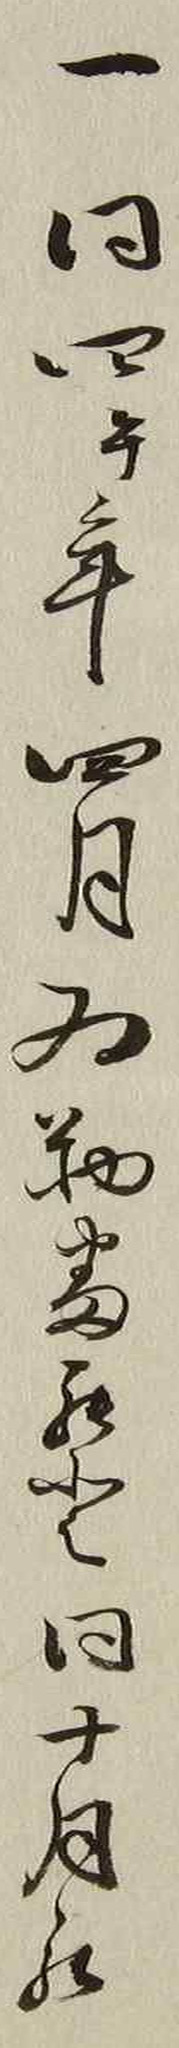一同四午年四月為勤番罷登同十月罷
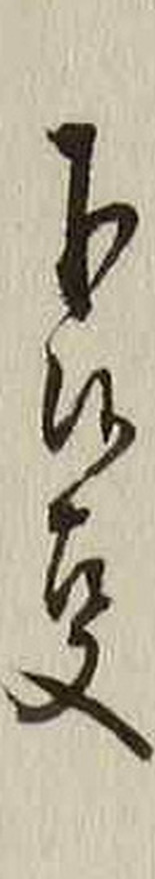下候事
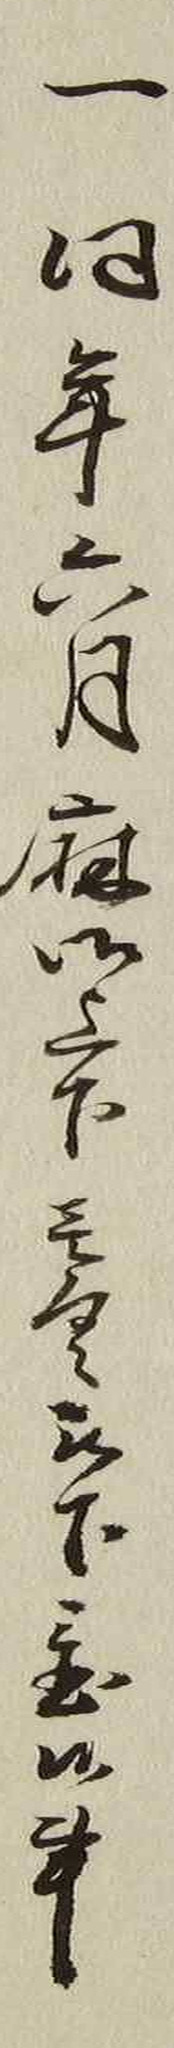一同年六月麻御上下壱具被下置候事
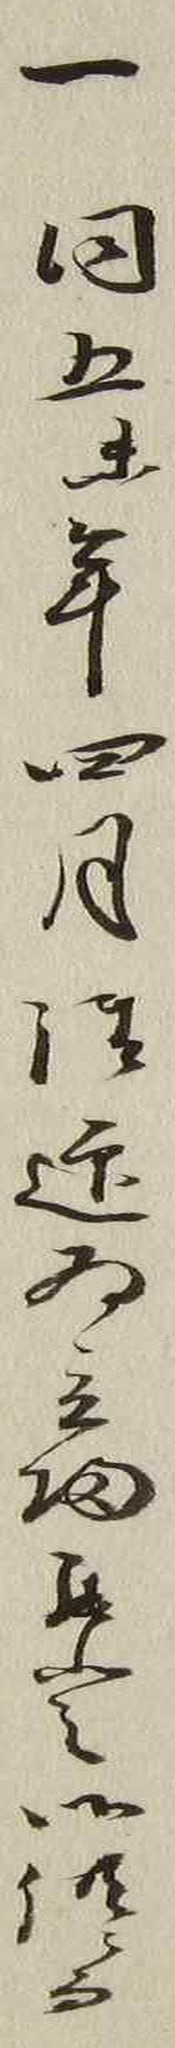一同五未年四月御迎為立帰罷登御供ニ而
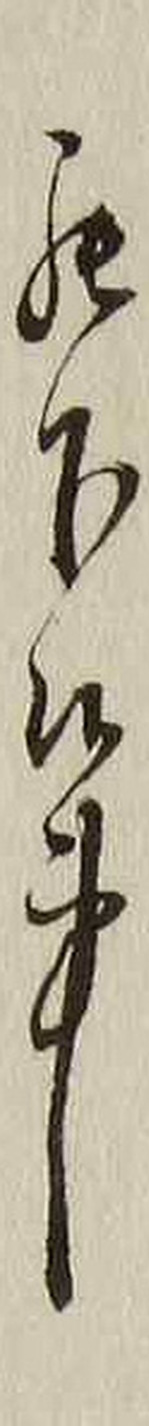罷下候事
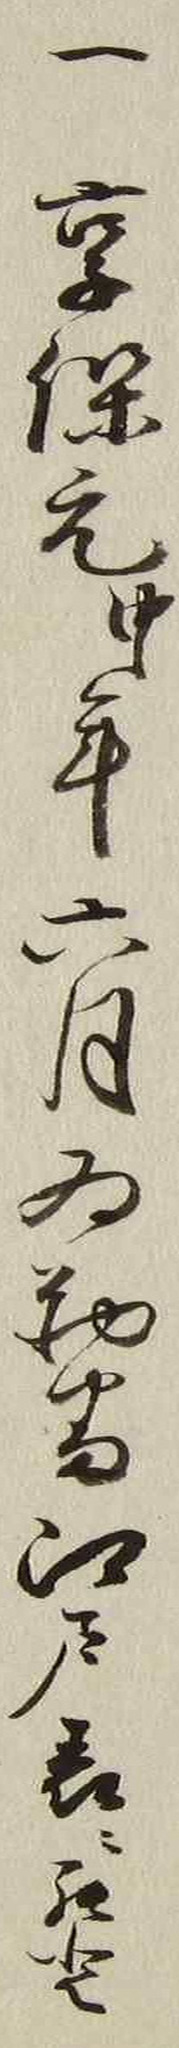一享保元申年六月為勤番江戸表ニ罷登
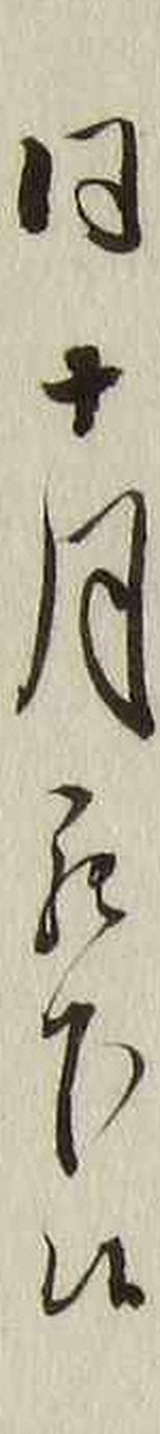同十月罷下候
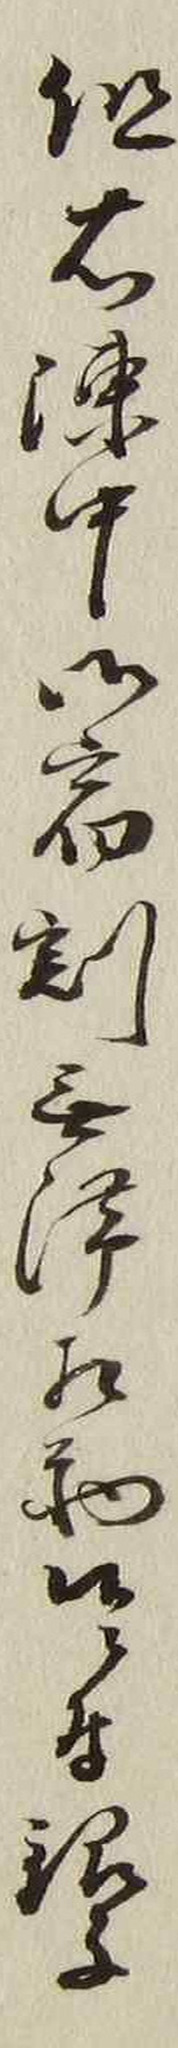但右陣中御宿割無滞相勤候ニ付銀子
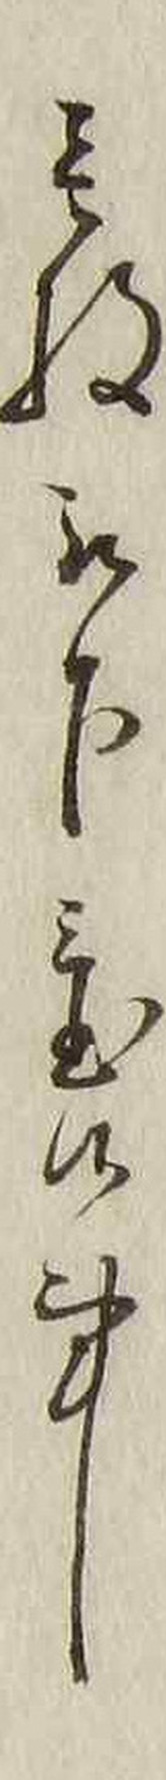壱枚被下置候事
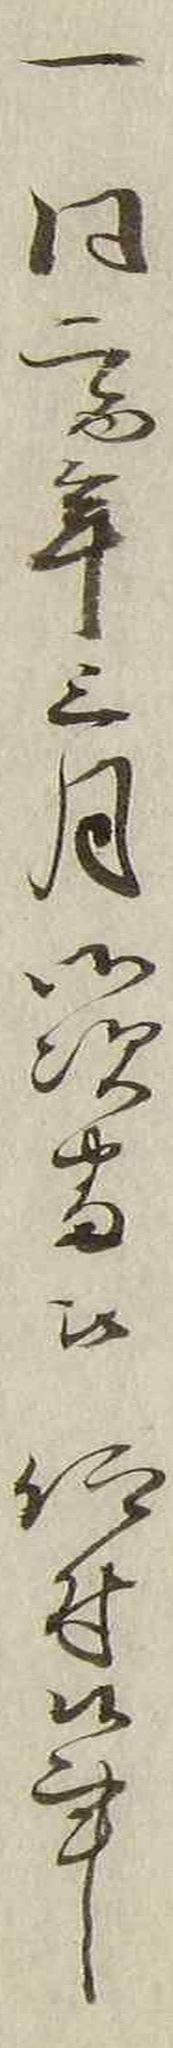一同二酉年三月御次番被仰付候事

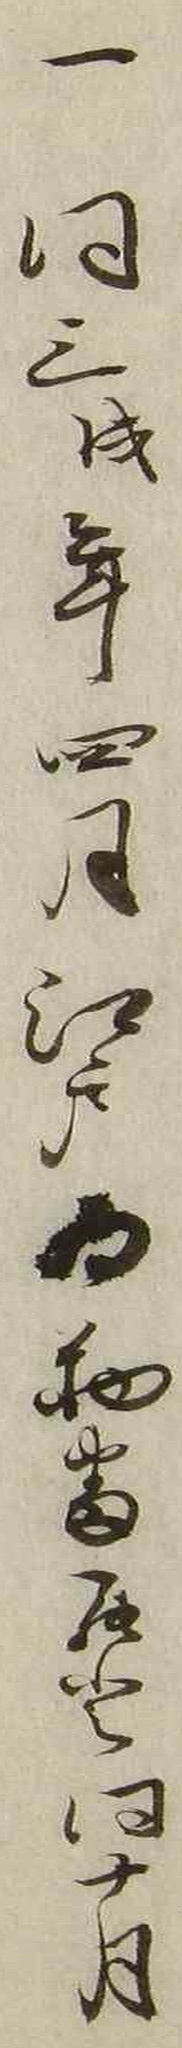一同三戌年四月江戸為勤番罷登同十月
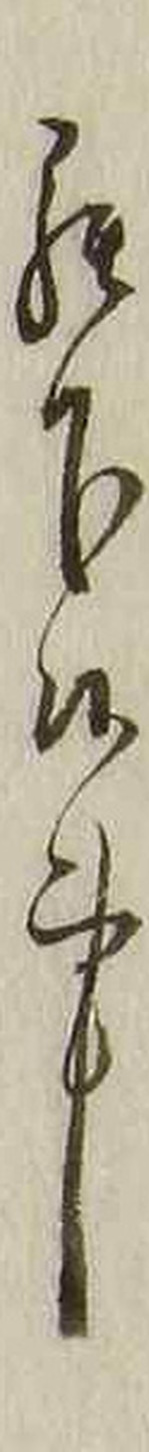罷下候事
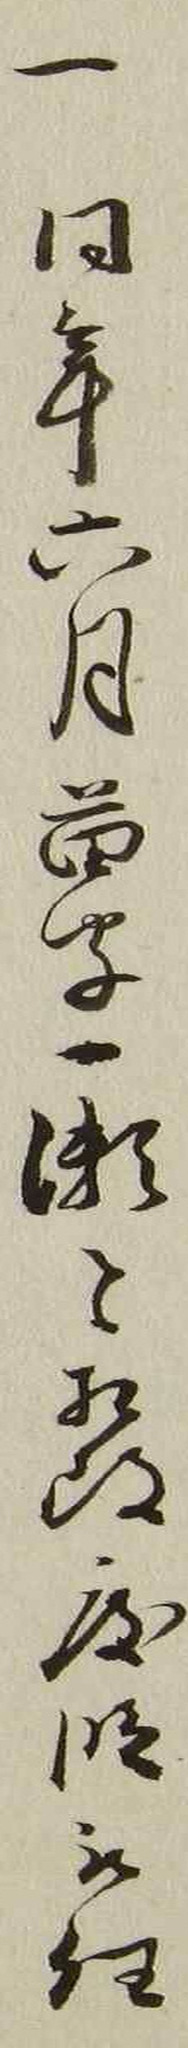一同年六月苗字一瀬と相改度段被任
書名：諸士系譜　巻之26　い之部26
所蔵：会津若松市立会津図書館
